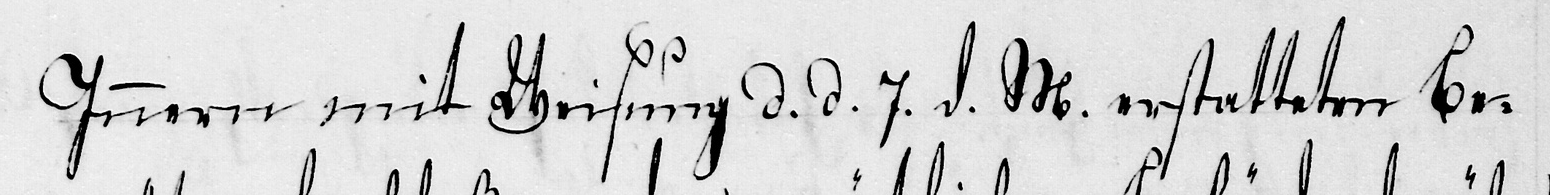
Innern mit Weisung d. d. 7. d. M. erstatteten Be¬
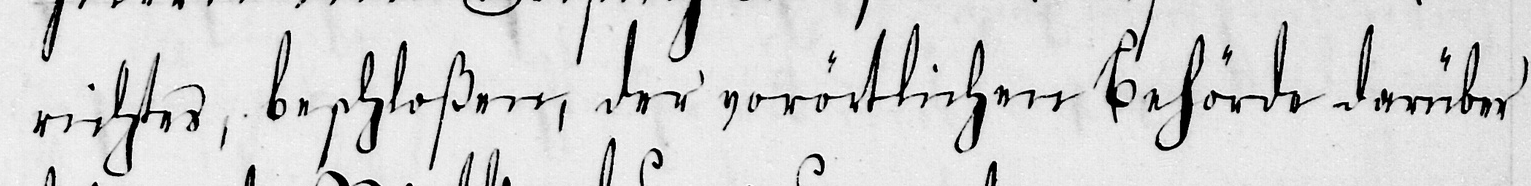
richtes, beschloßen, der vorörtlichen Behörde darüber
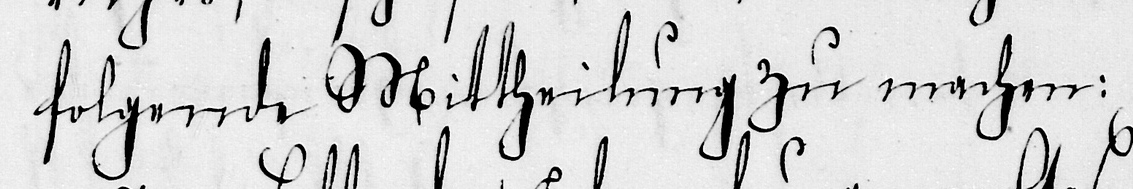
folgende Mittheilung zu machen:
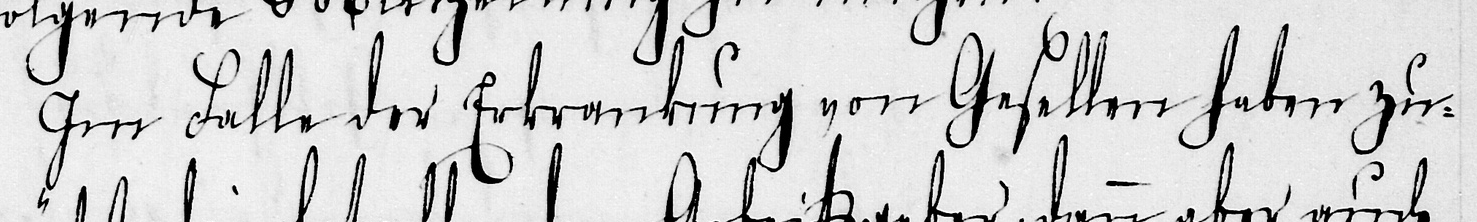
Im Falle der Erkrankung von Gesellen haben zu¬
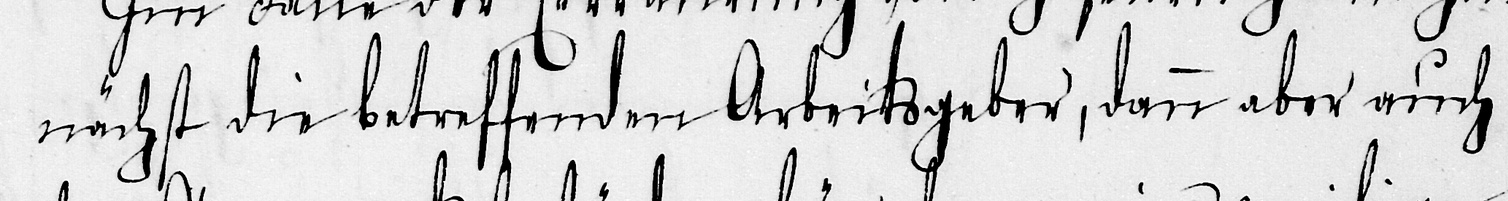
nächst die betreffenden Arbeitsgeber, dann aber auch
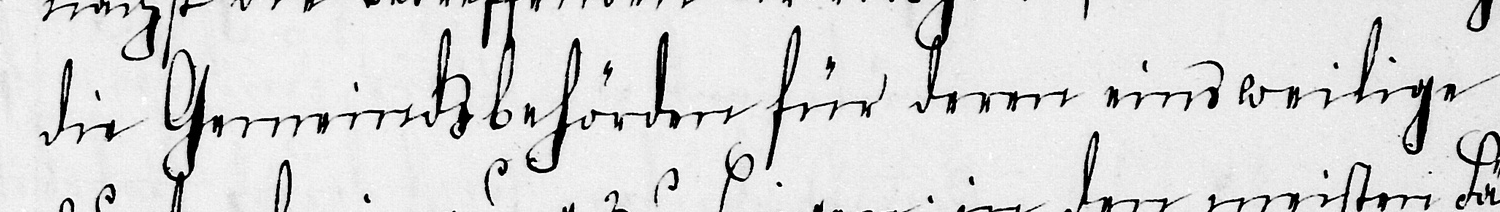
die Gemeindsbehörden für deren einsweilige
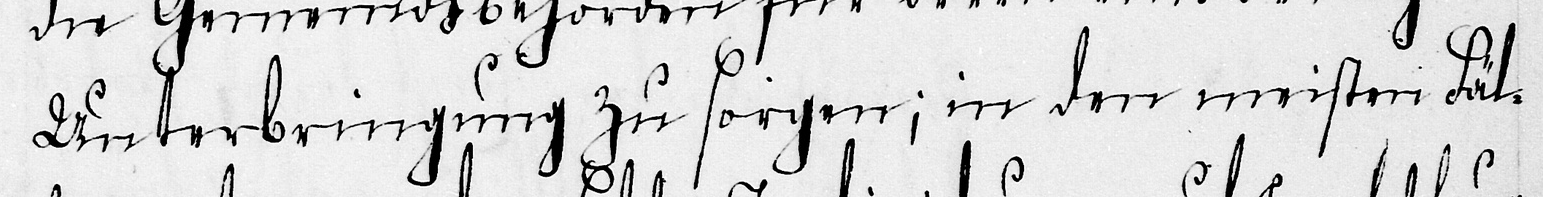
Unterbringung zu sorgen; in den meisten Fäl¬
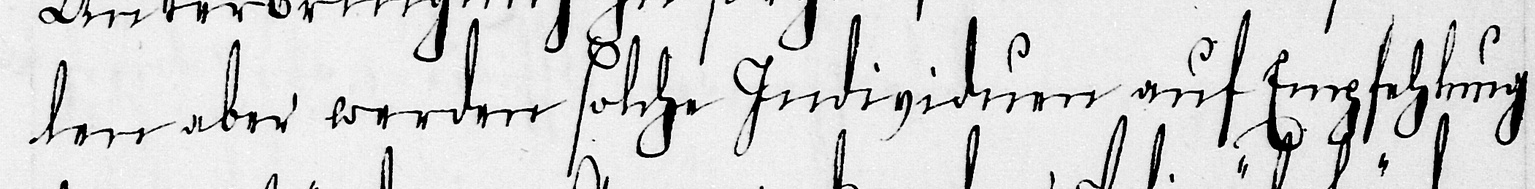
len aber werden solche Individuen auf Empfehlung
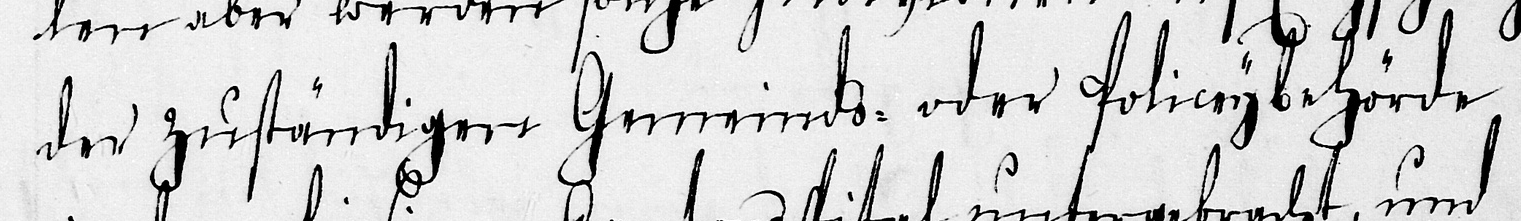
der zuständigen Gemeinds- oder Policeybehörde
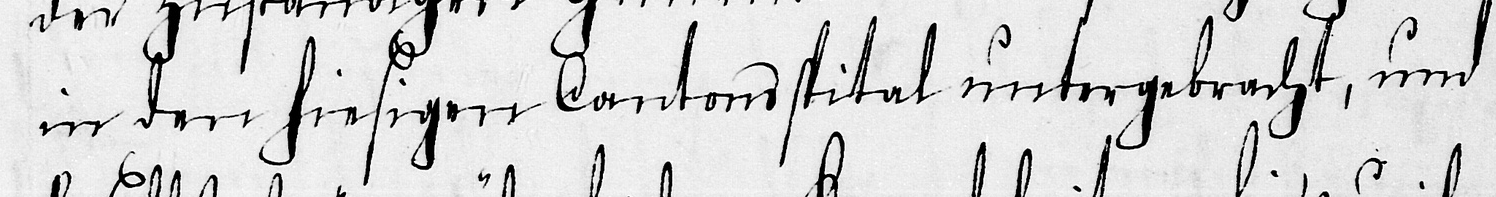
in den hiesigen Cantonsspital untergebracht, und
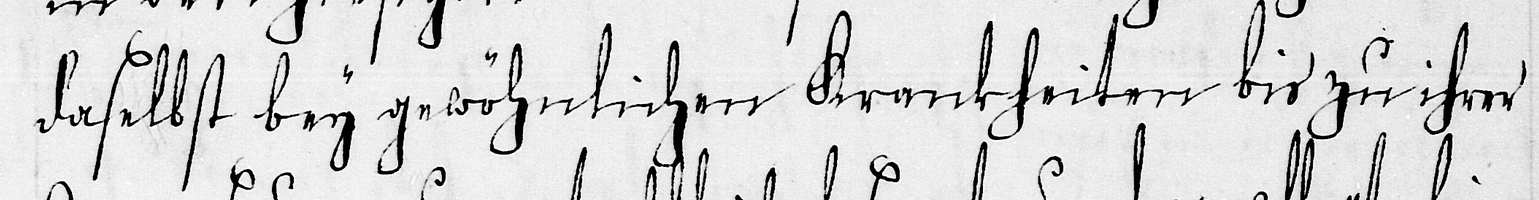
daselbst bey gewöhnlichen Krankheiten bis zu ihrer
